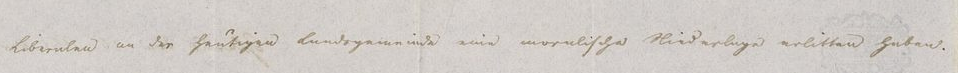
Liberalen an der heutigen Landsgemeinde eine moralische Niederlage erlitten haben.
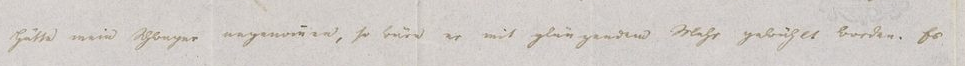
Hätte mein Schwager angenommen, so wäre er mit glänzendem Mehr gewählt worden. Es
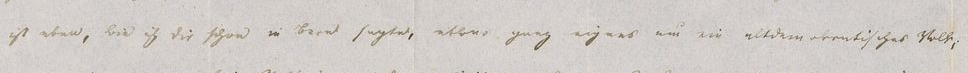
ist eben, wie ich Dir schon in Bern sagte, etwas ganz eignes um ein altdemokratisches Volk;
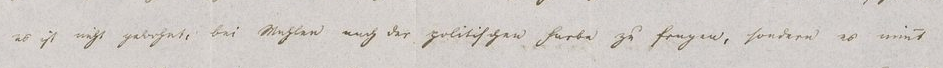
es ist nicht gewohnt, bei Wahlen nach der politischen Farbe zu fragen, sondern es nimmt
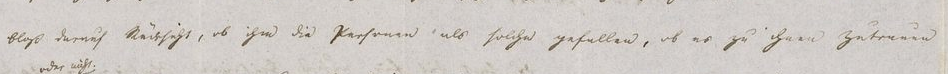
bloß darauf Rücksicht, ob ihm die Personen als solche gefallen, ob es zu ihnen Zutrauen
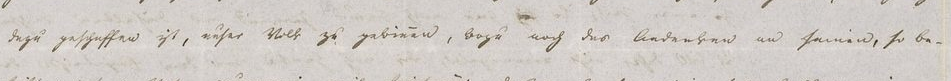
dazu geschaffen ist, unser Volk zu gewinnen, wozu noch das Andenken an seinen, so be-
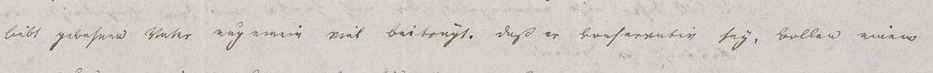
liebt gewesnen Vater ungemein viel beiträgt. Daß er konservativ sey, wollen einem
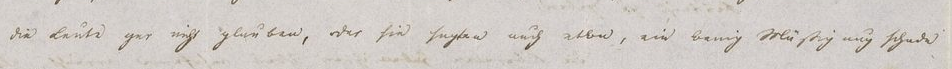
die Leute gar nicht glauben, oder sie sagten auch etwa, ein wenig Müßiggang schade
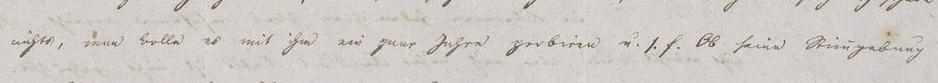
nichts, man wolle es mit ihm ein paar Jahre probiren u. s. f. Ob seine Stimmgebung
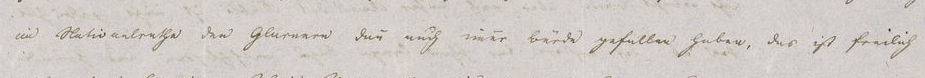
im Nationalrathe den Glarnern dann auch immer würde gefallen haben, das ist freilich
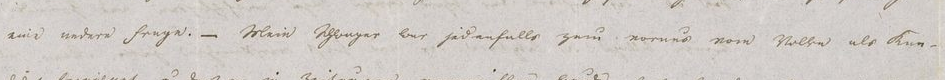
eine andere Frage. – Mein Schwager war jedenfalls zum voraus vom Volke als Kan-
